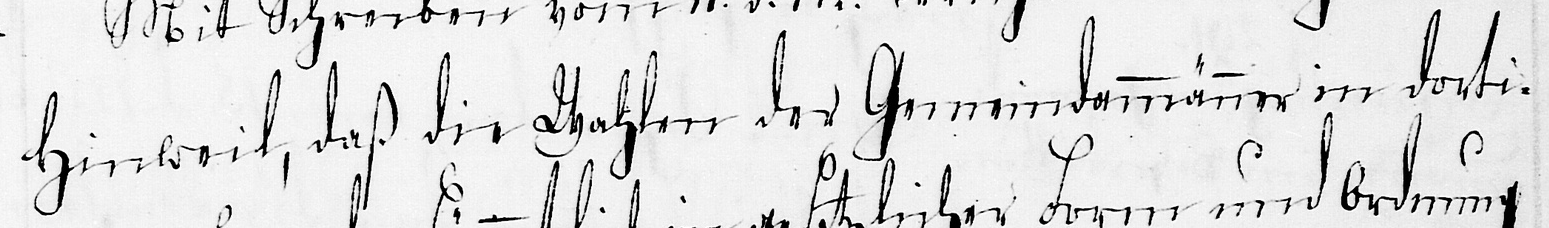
Hinweil, daß die Wahlen der Gemeindammänner in dorti¬
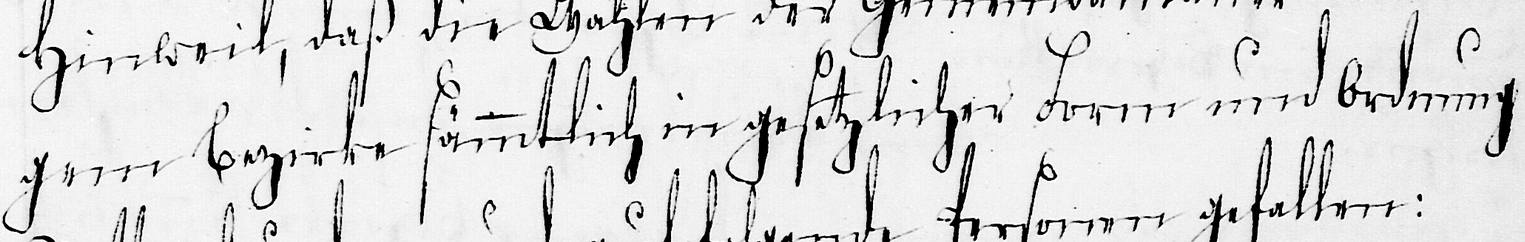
gem Bezirke sämmtlich in gesetzlicher Form und Ordnung
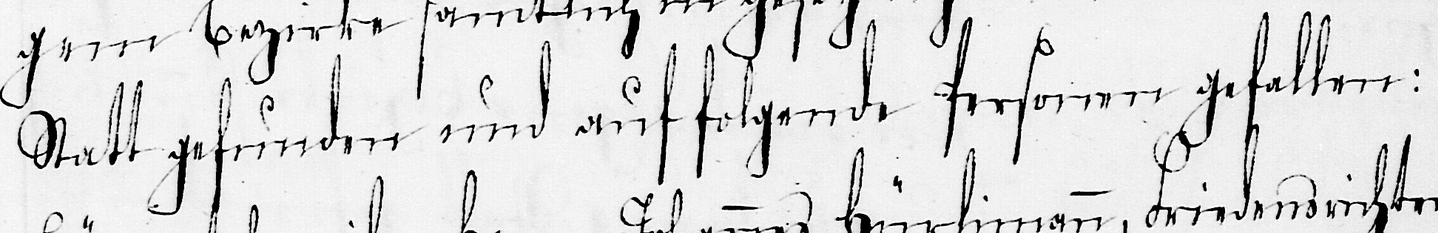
Statt gefunden und auf folgende Personen gefallen:
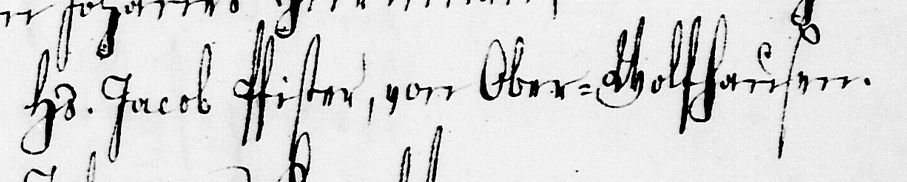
Hs. Jacob Pfister, von Ober-Wolfhausen.
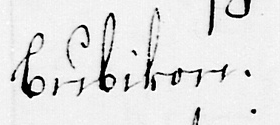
Bubikon.
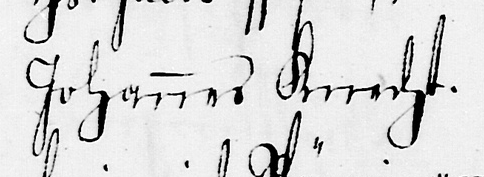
Johannes Knecht.
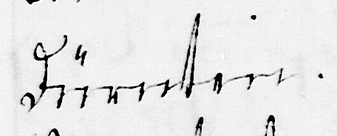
Dürnten.
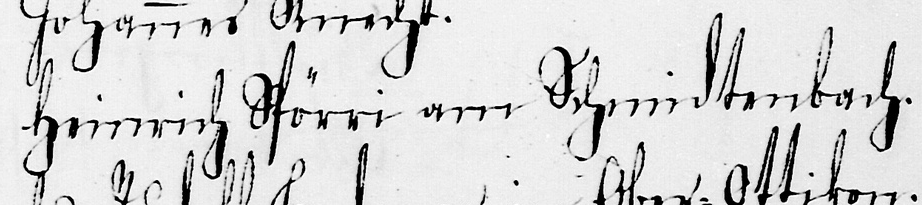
Heinrich Spörri am Schmidtenbach.
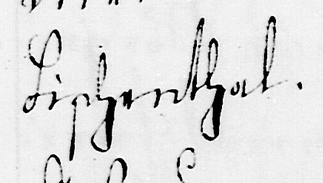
Fischenthal.
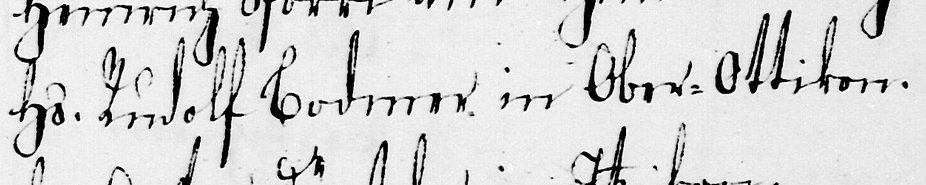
Hs. Rudolf Bodmer in Ober-Ottikon.
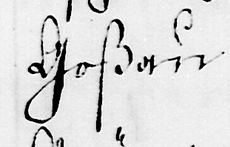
Goßau.
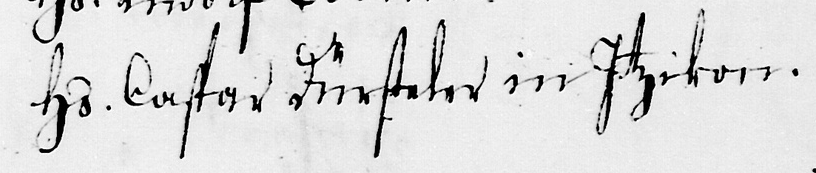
Hs. Caspar Dürsteler in Itzikon.
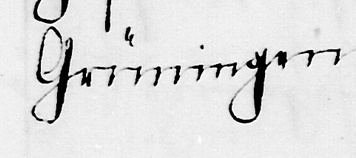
Grüningen
